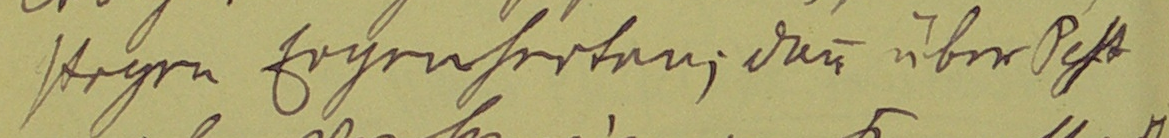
stige Eigenheiten;-- dann über Pest
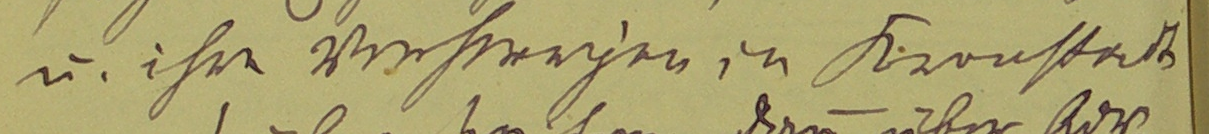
und ihre Verherrungen in Kronstadt
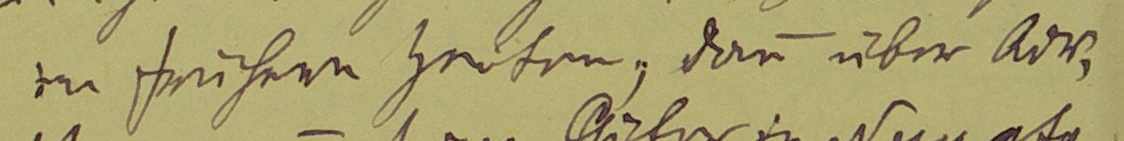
in früheren Zeiten;- dann über Adv.
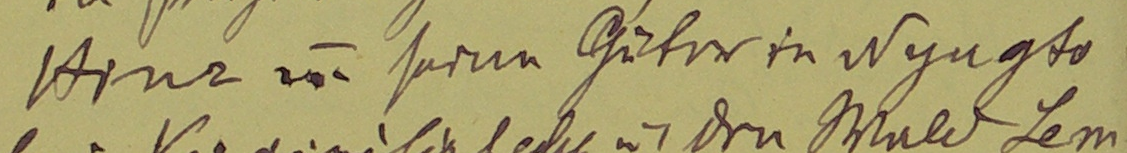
Hinz und seine Güter in Nyagato
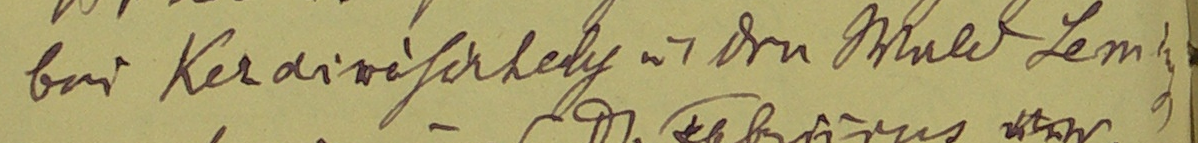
bei Kerdirohiehely und den Wald Leminy,
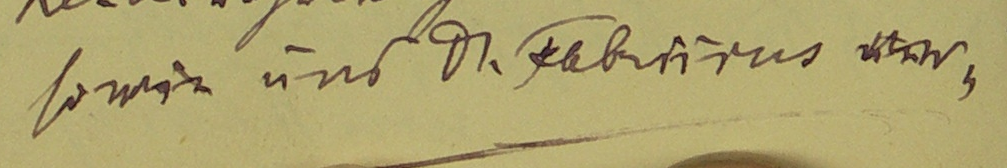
so wie uns Dr. Fabricius er¬
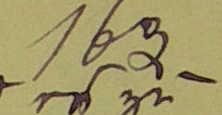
163
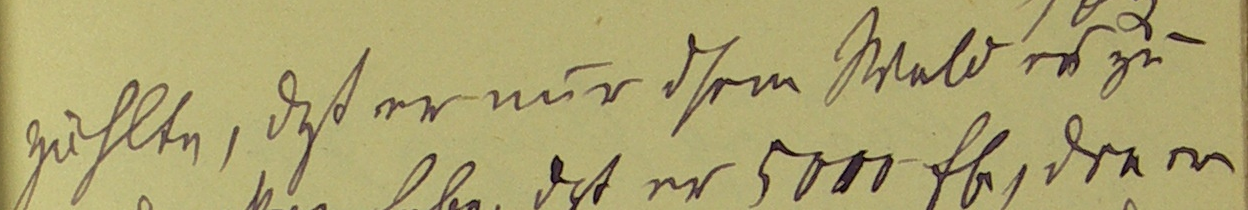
zählte, daß er nur diesem Wald es zu
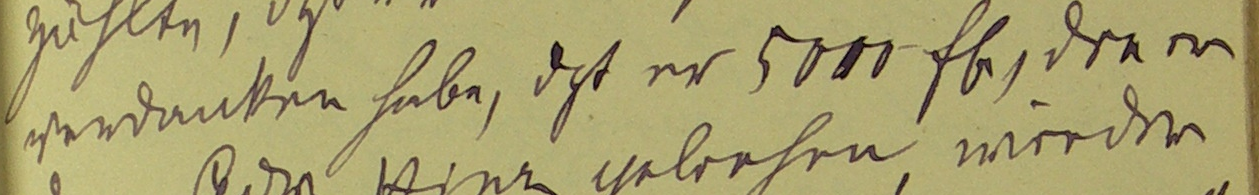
verdanken habe, daß er 5000 Fl., die er
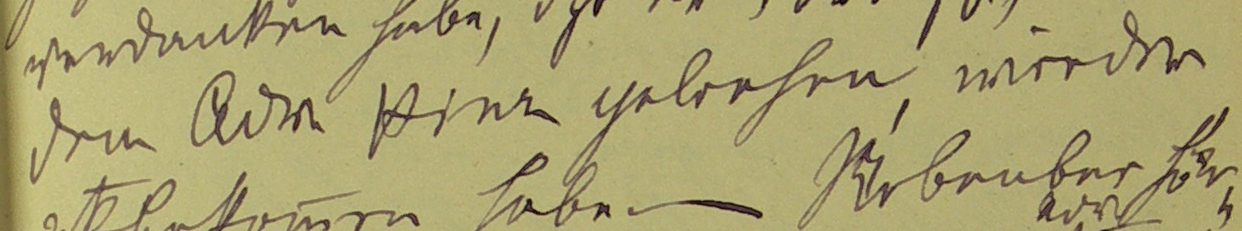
dem Adv. Hinz geliehen, wieder
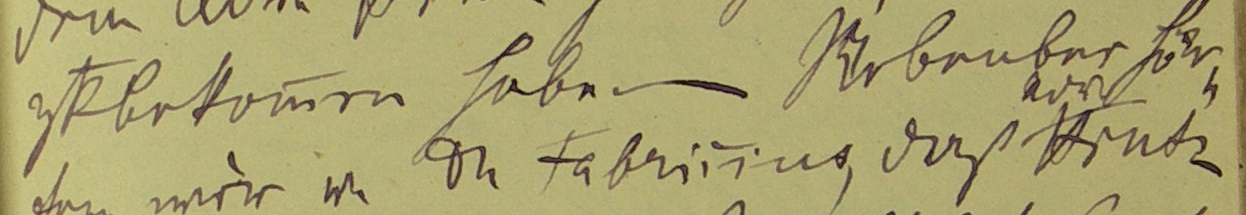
zurückbekommen habe.- Nebenher hör¬
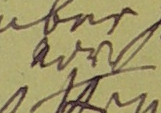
Adv.
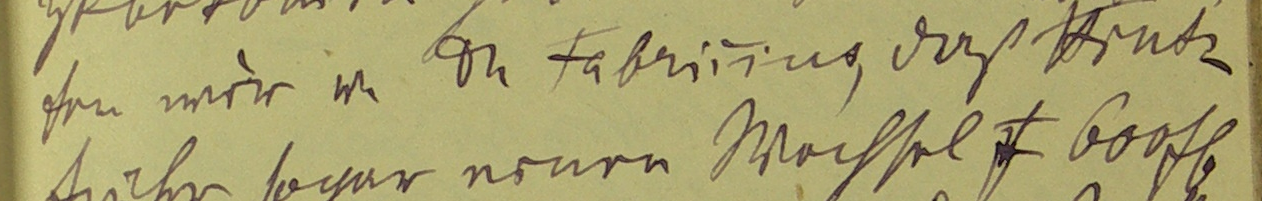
ten wir von Dr. Fabricius, daß Hintz
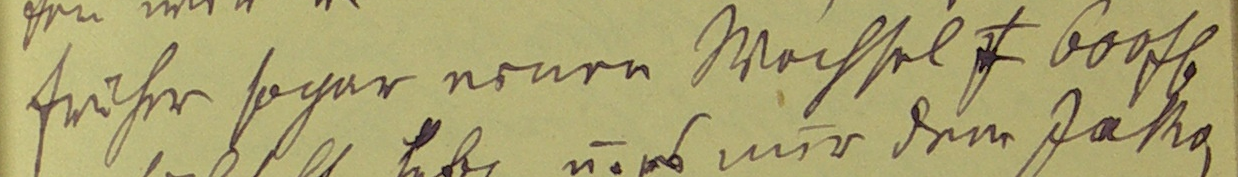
früher sogar einen Wechsel mit 600 Fl.
